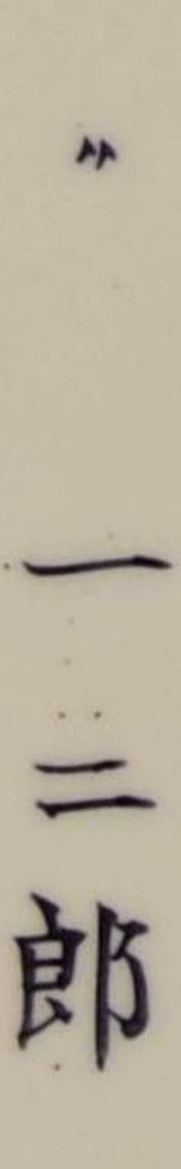一二郎
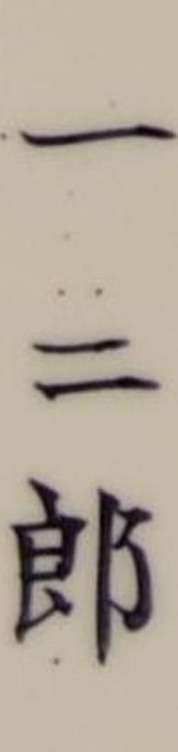一二郎
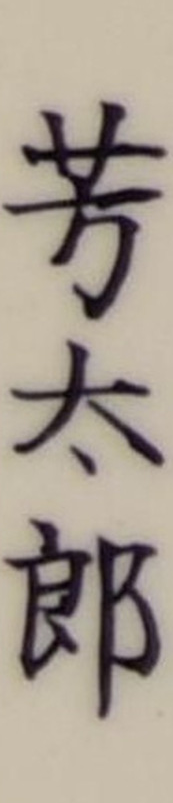芳太郎

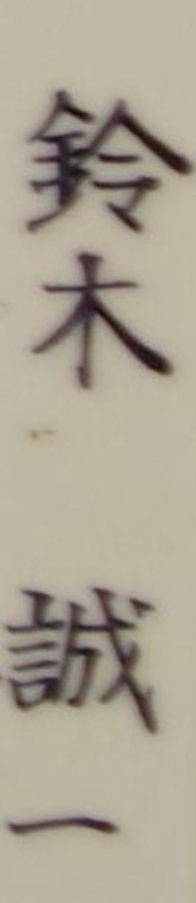鈴木誠一
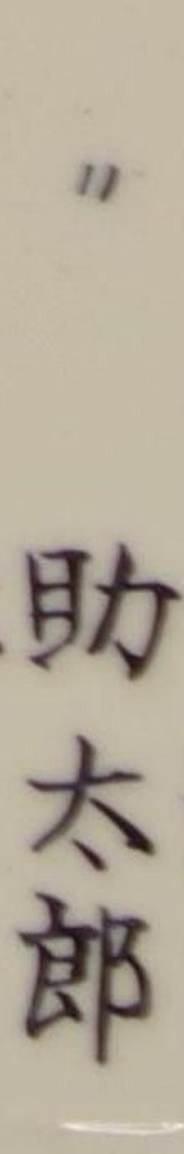助太郎
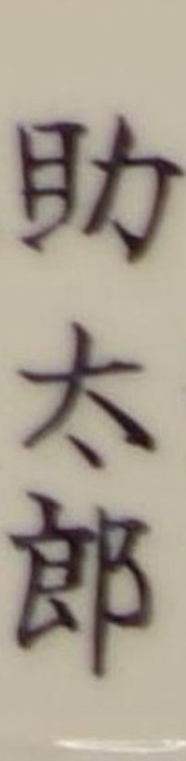助太郎
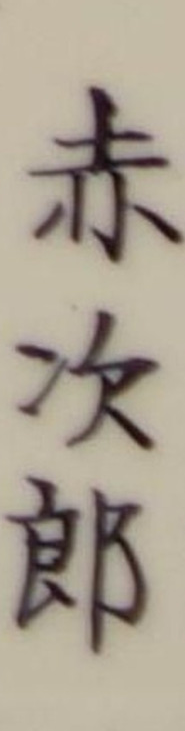赤次郎
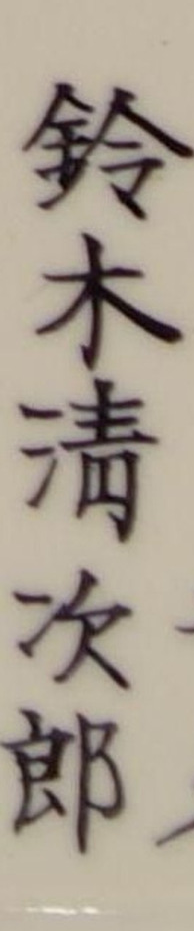鈴木清次郎
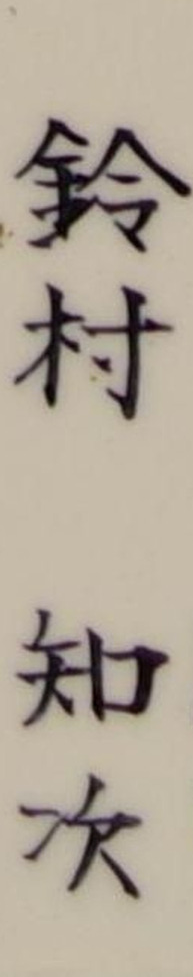鈴村知次
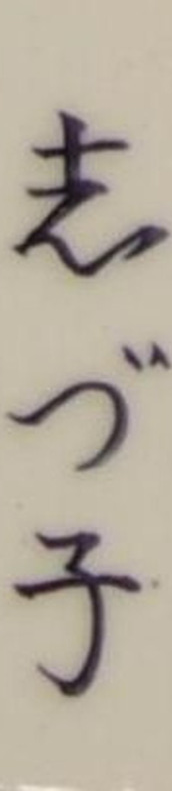しづ子
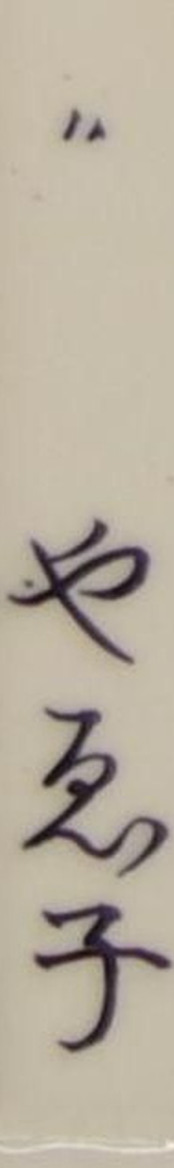やえ子
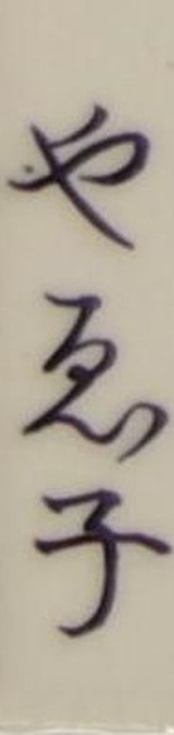やえ子

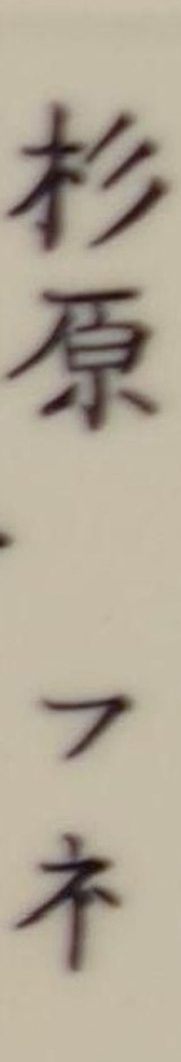杉原フネ
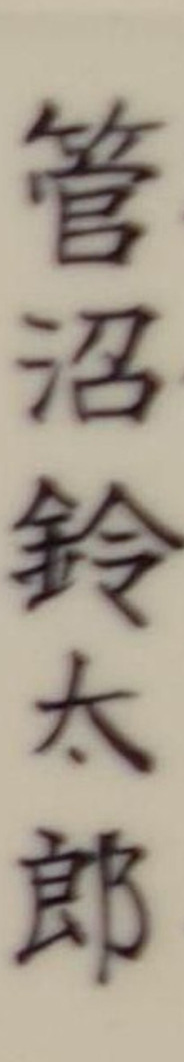菅沼鈴太郎
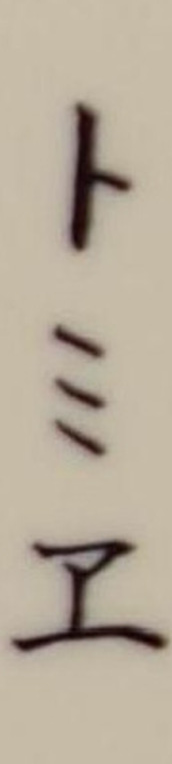トミエ
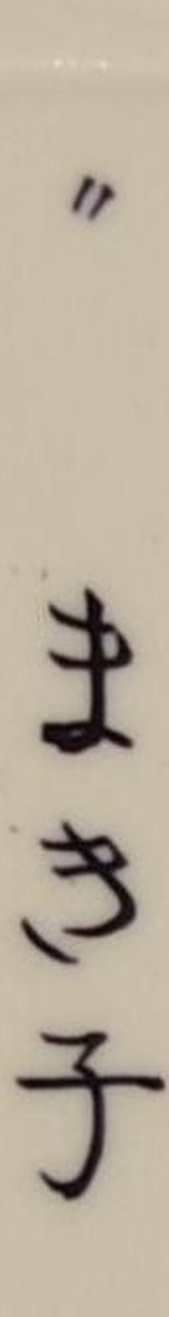まき子
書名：M~S
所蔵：高野山金剛峯寺
